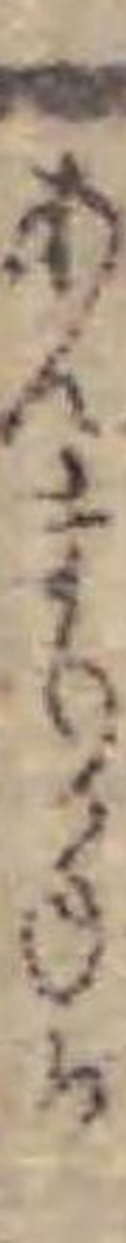あんまり手が
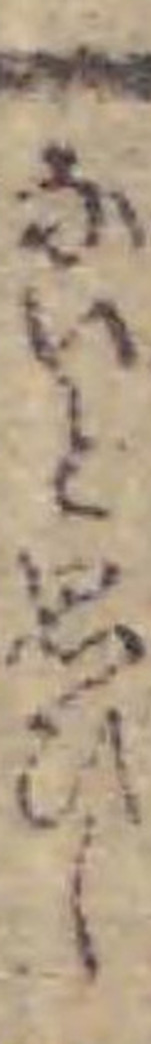ないと思ひし
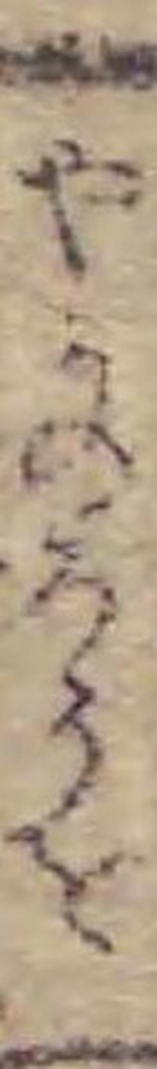やかのろうを
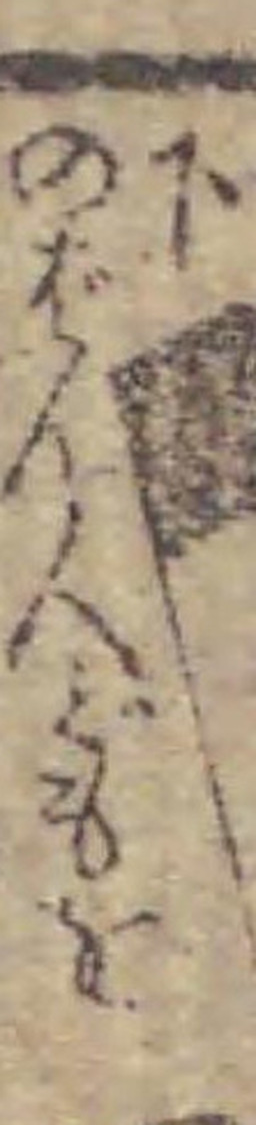のばん人どもを
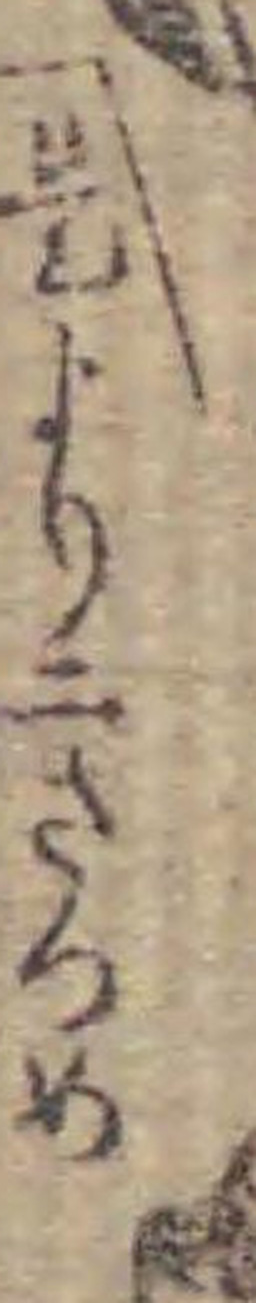〽是より二さつめ
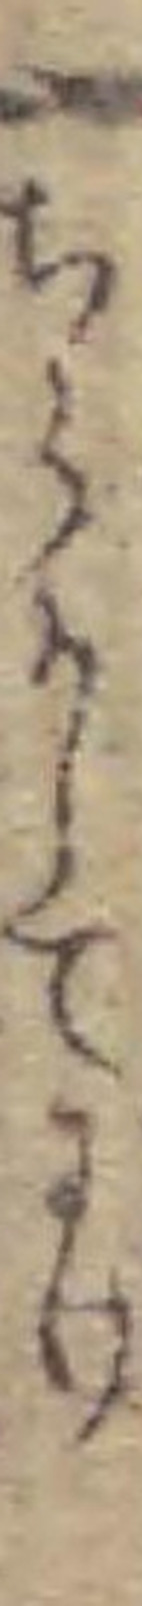ちらかしてにげ
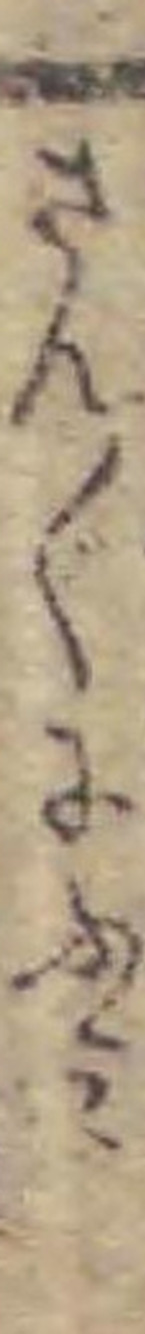さん〴〵にふみ
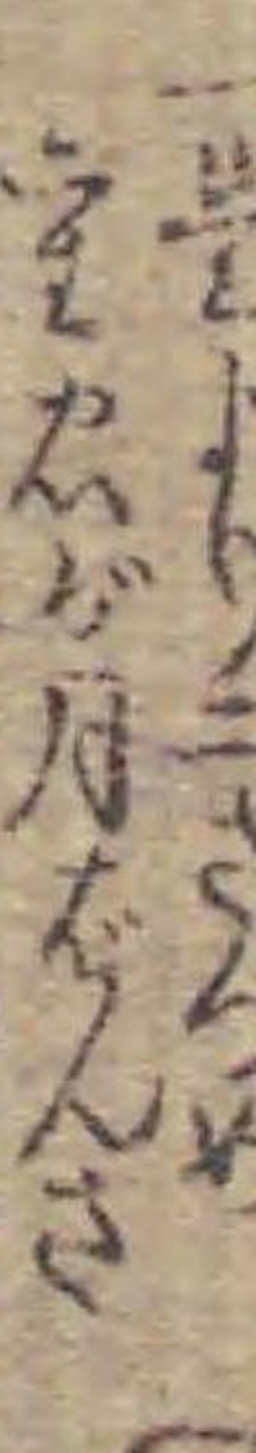重忠が月ばんさ
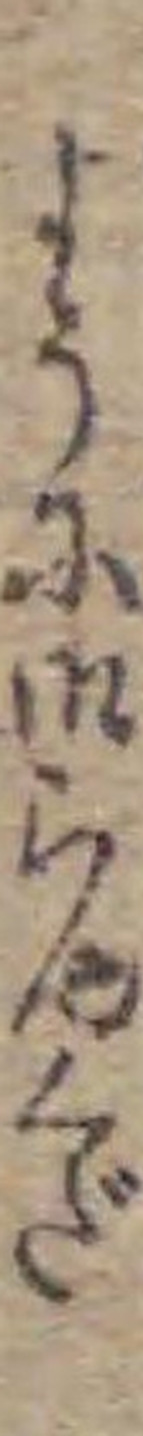ように御らんくだ
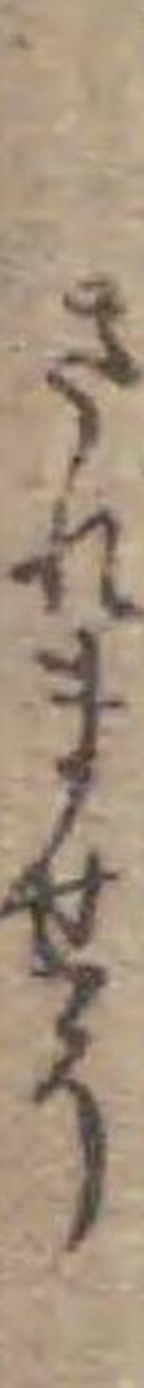されませう
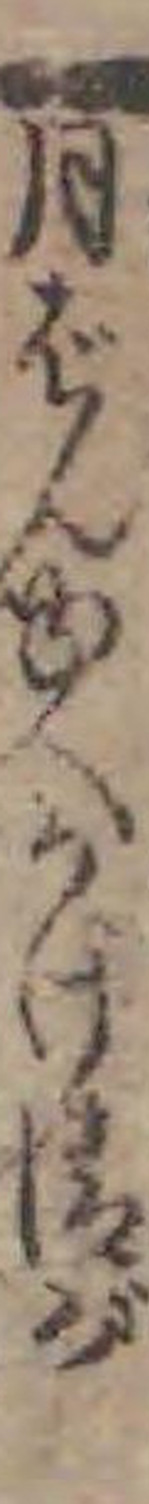月ばんゆへかげ清が
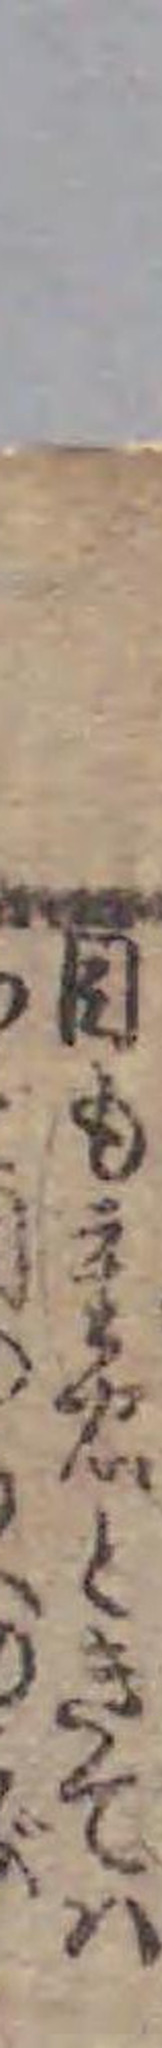目も重忠ときては
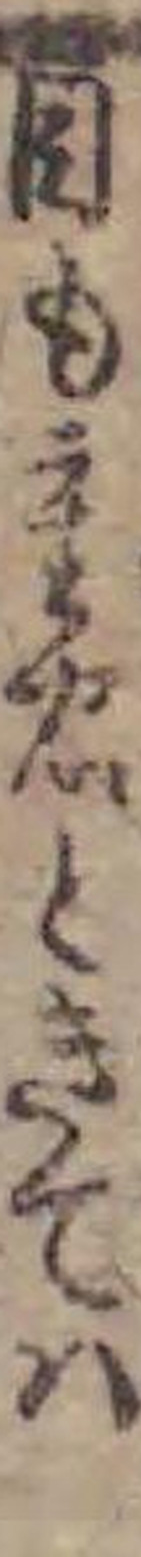目も重忠ときては
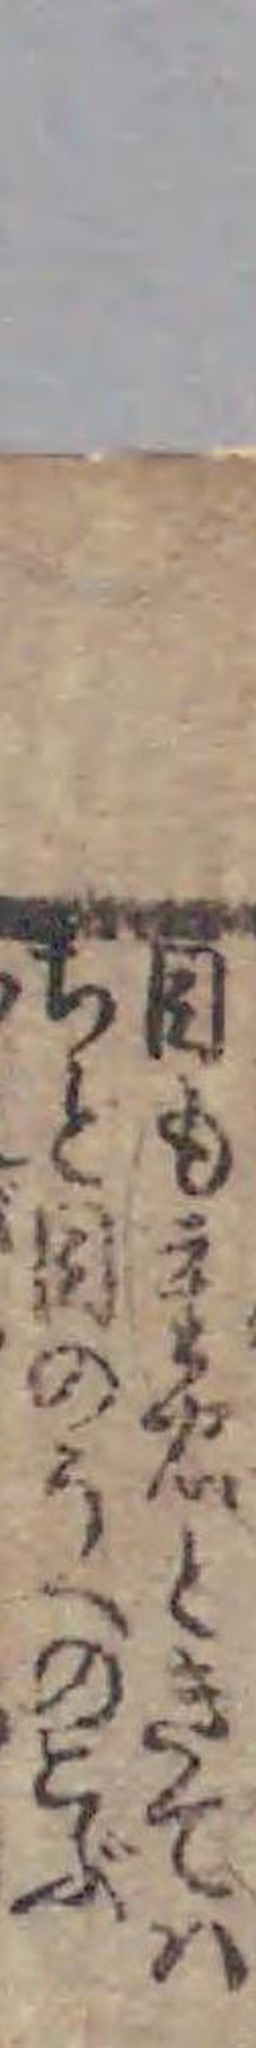ちと目のうへのこぶ
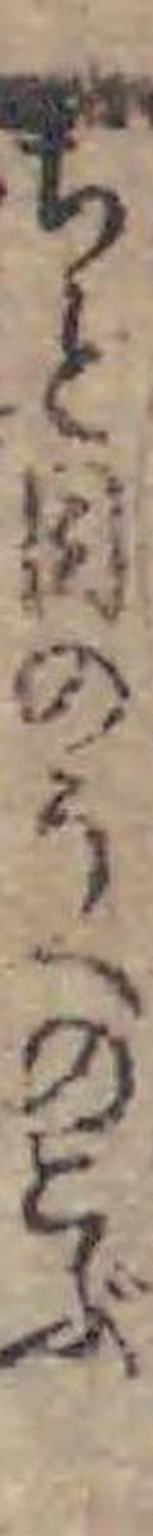ちと目のうへのこぶ
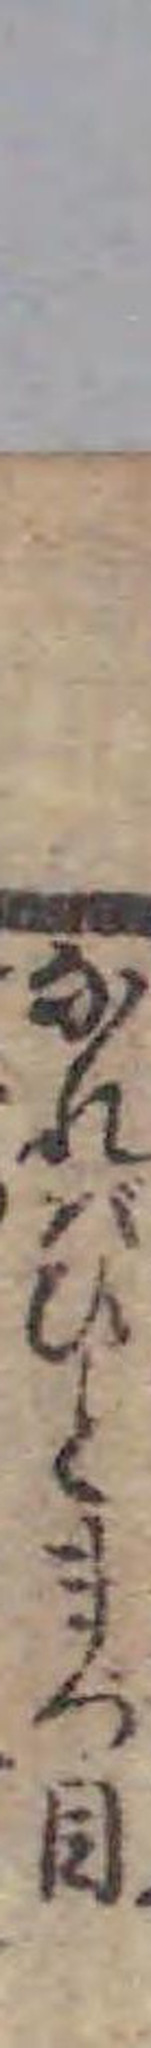なればひとまづ目
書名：悪七変目景清 : 2巻
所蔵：国立国会図書館 National Diet Library, JAPAN
